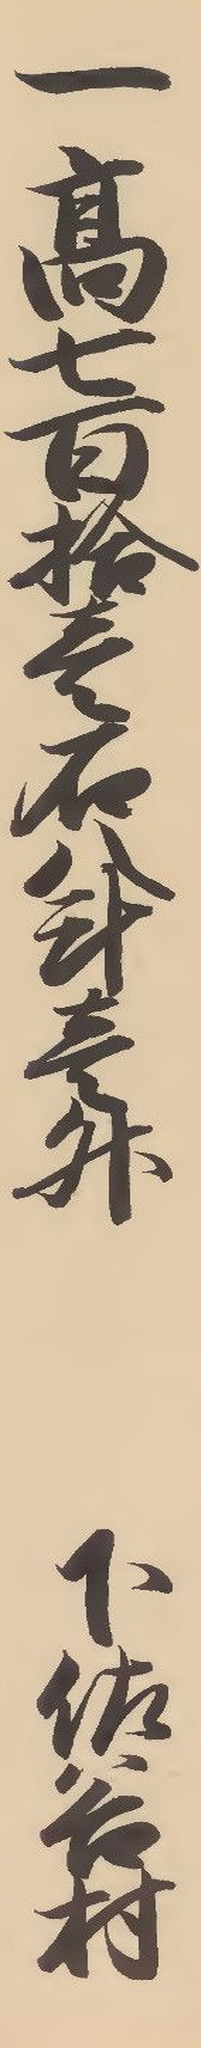一高七百拾壱石八斗壱升下佐谷村
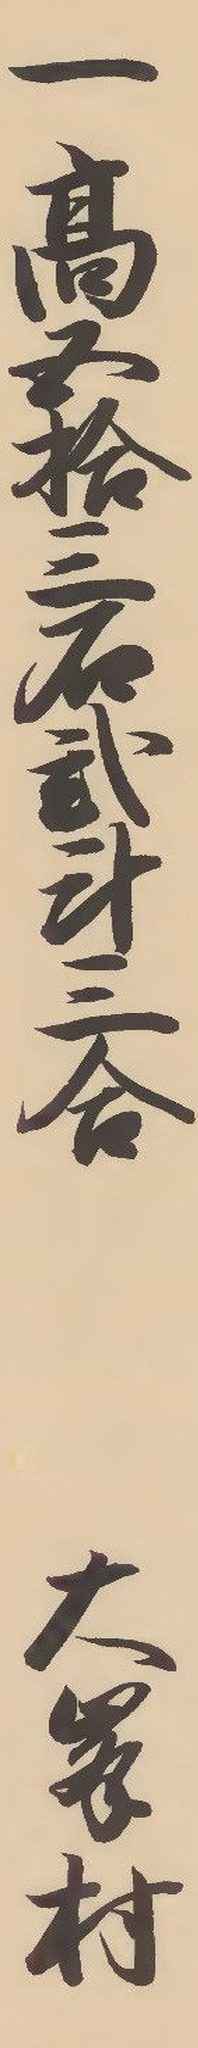一高五拾三石弐斗三合大峯村

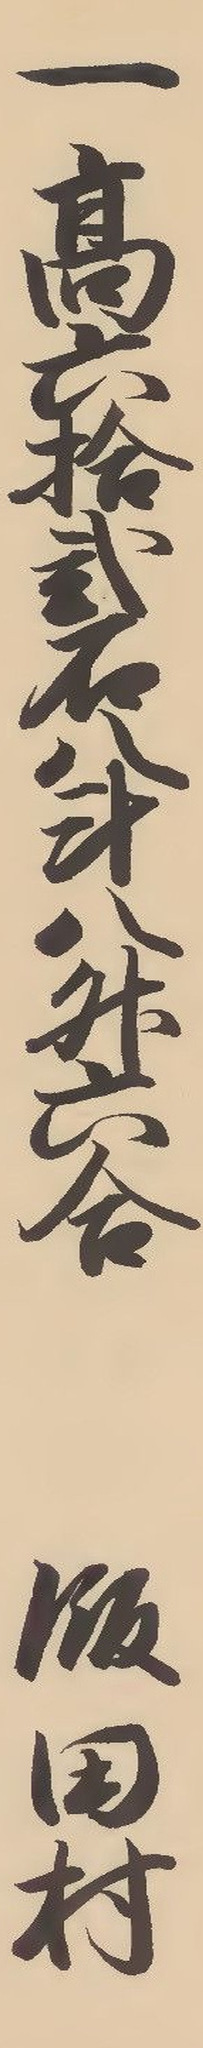一高六拾弐石八斗八升六合飯田村
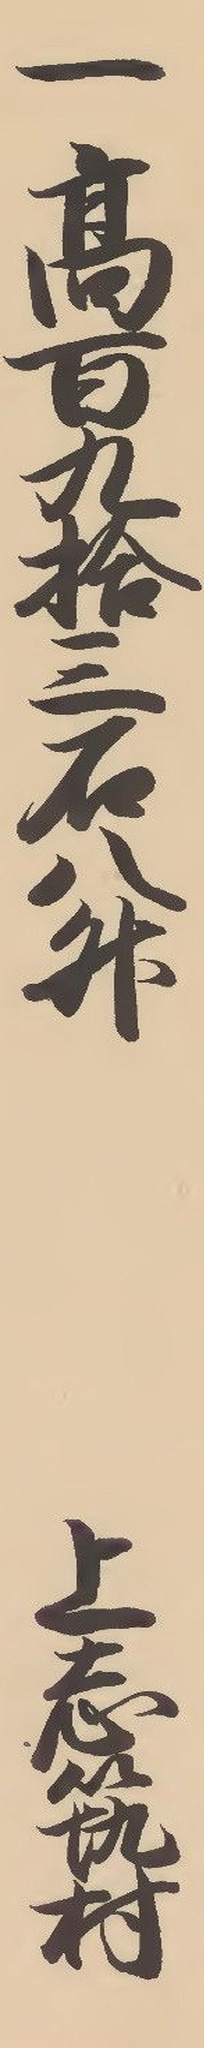一高百九拾三石八升上志筑村
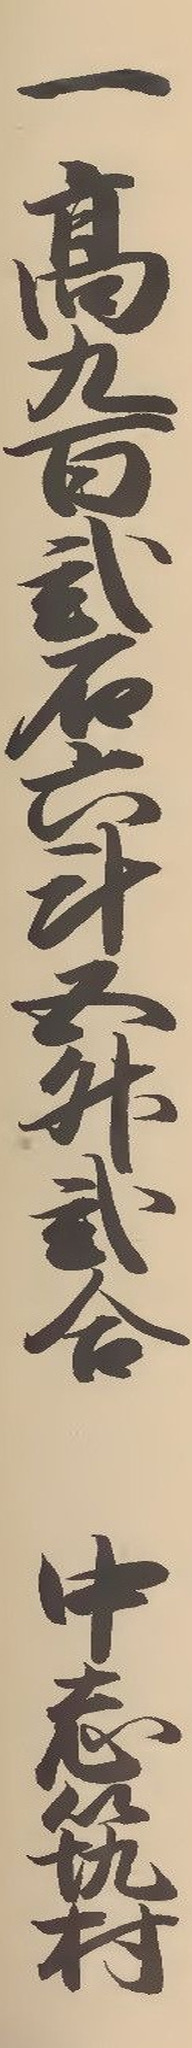一高九百弐石六斗五升弐合中志筑村
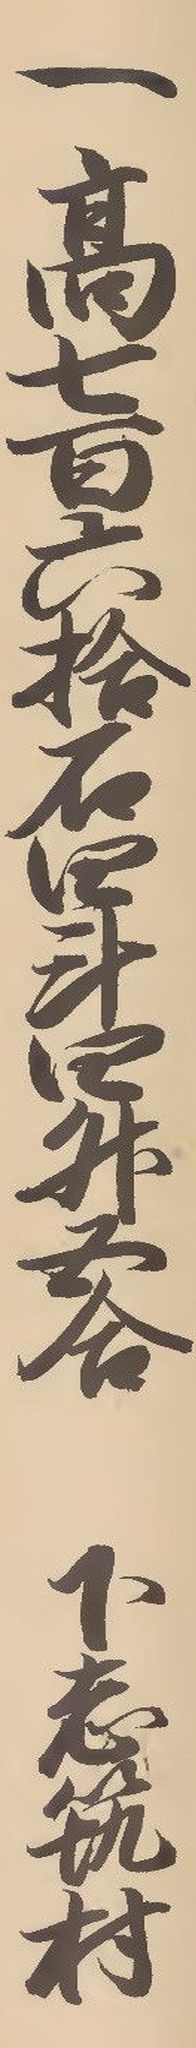一高七百六拾石四斗四升五合下志筑村
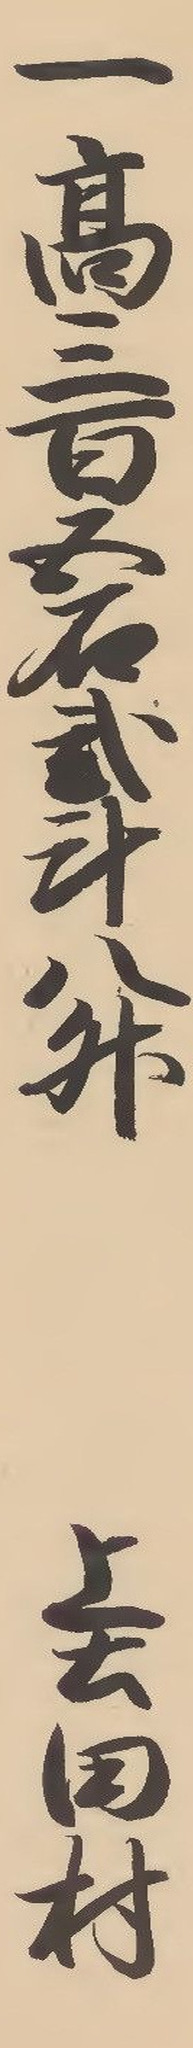一高三百五石弐斗八升上土田村
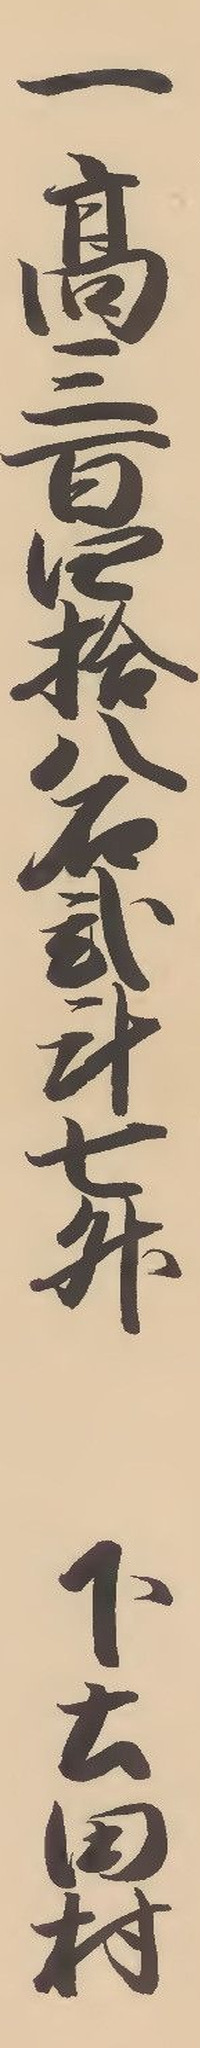一高三百四拾八石弐斗七升下土田村
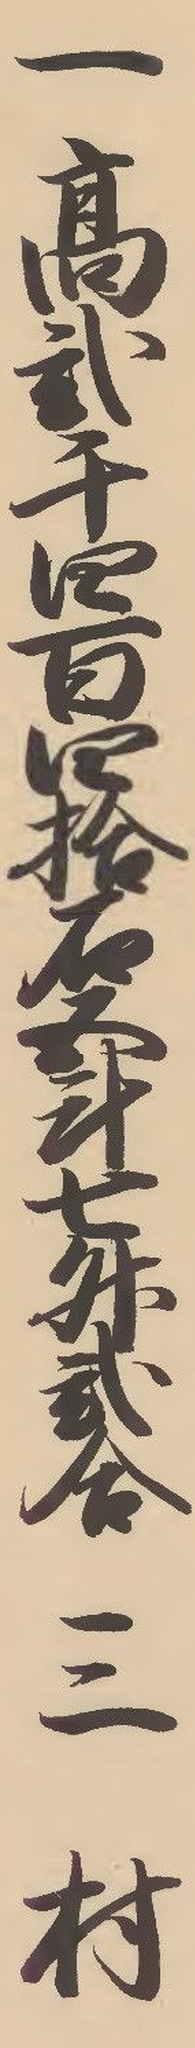一高弐千四百四拾石五斗七升弐合三村

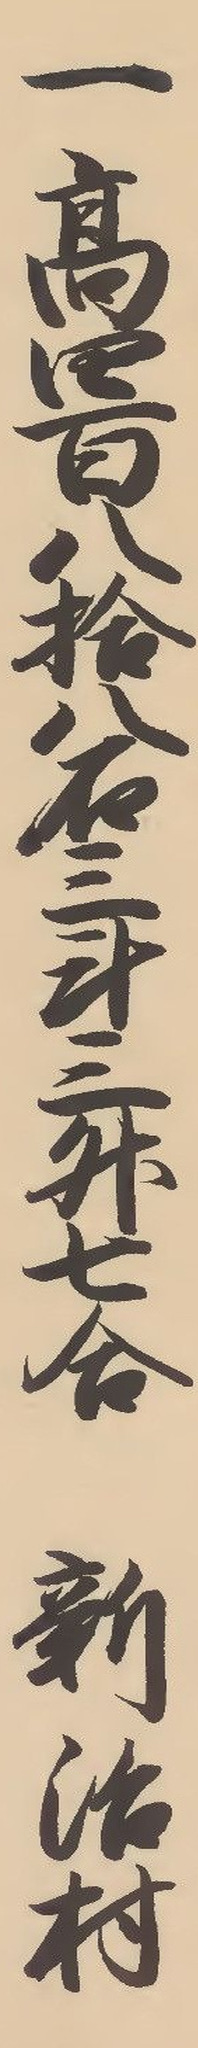一高四百八拾八石三斗三升七合新治村
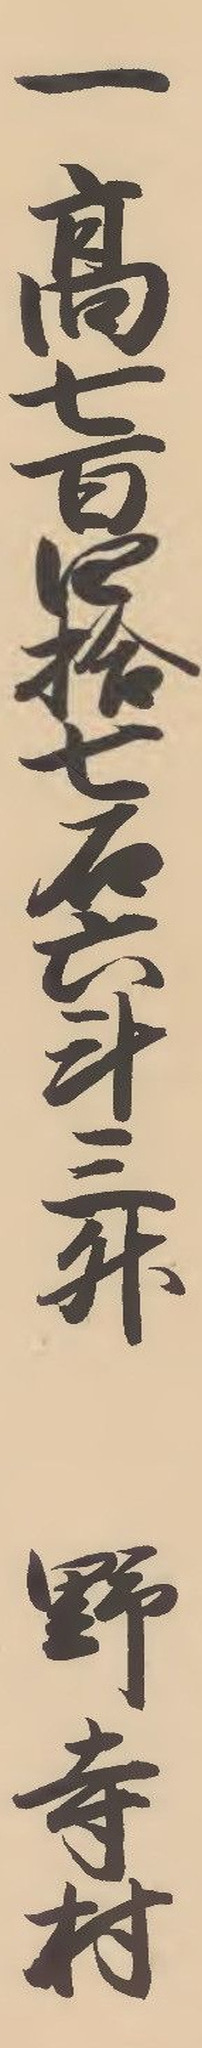一高七百四拾七石六斗三升野寺村
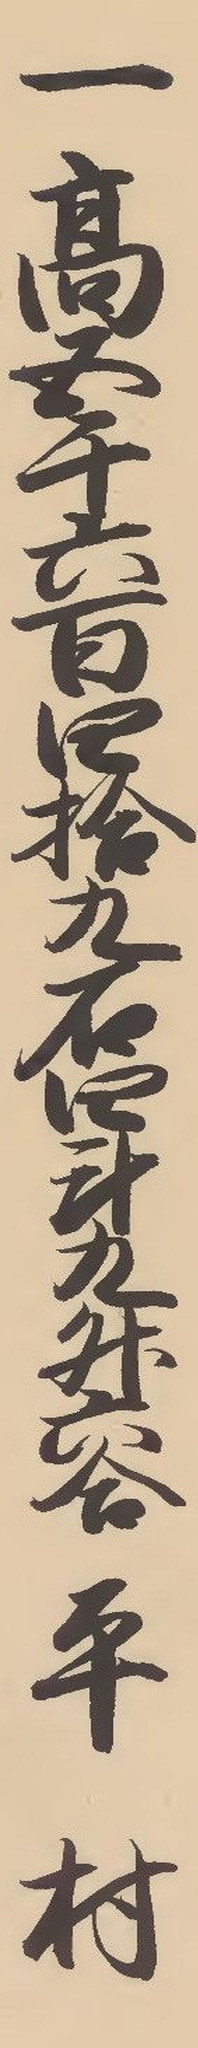一高五千六百四拾九石四斗九升六合平村
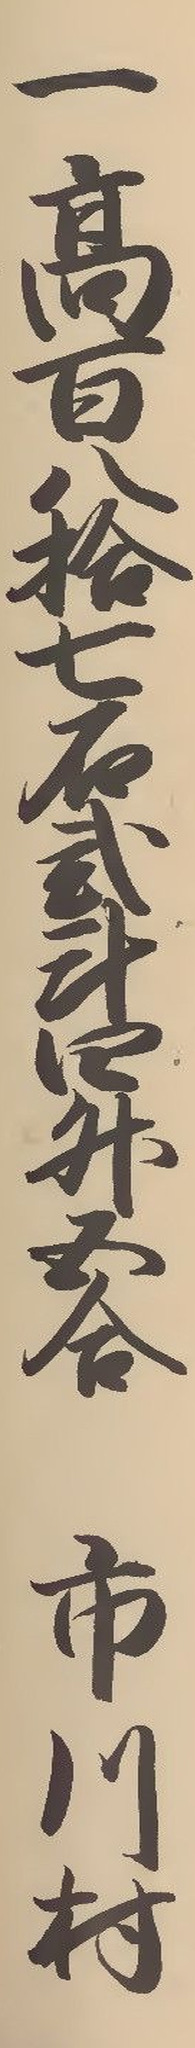一高百八拾七石弐斗四升五合市川村
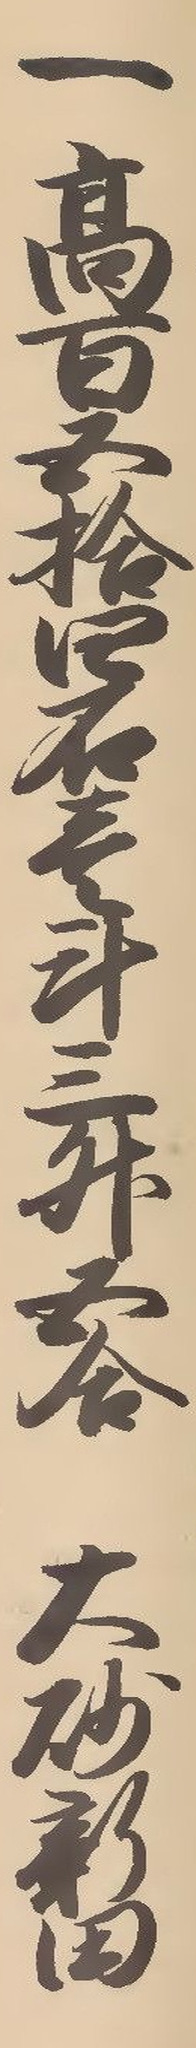一高百五拾四石壱斗三升五合大砂新田
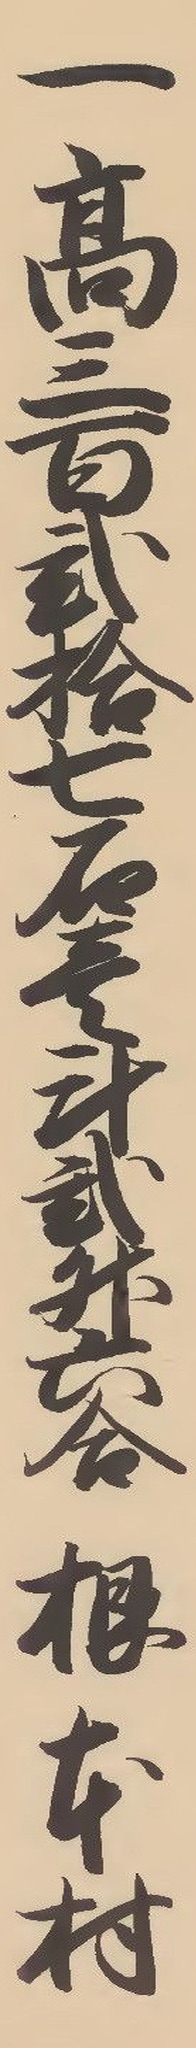一高三百弐拾七石壱斗弐升六合根本村
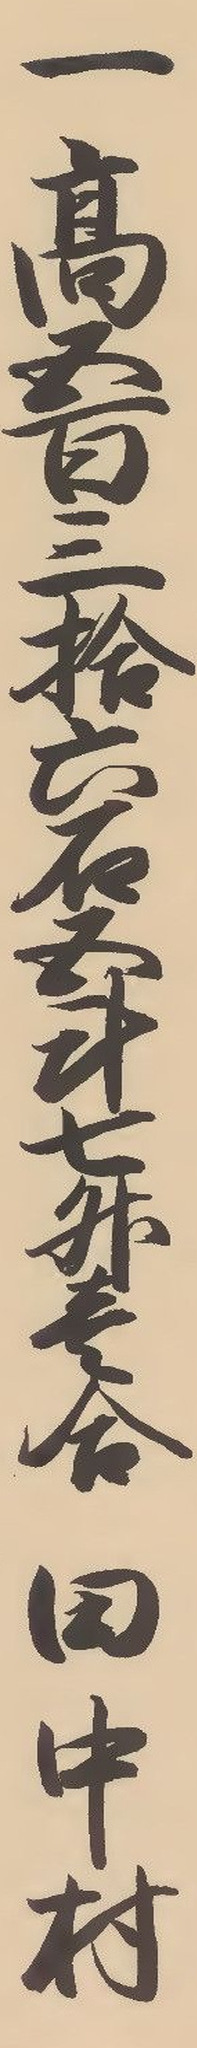一高五百三拾六石五斗七升壱合田中村
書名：常陸国郷帳
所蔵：国立公文書館 National Archives of Japan
